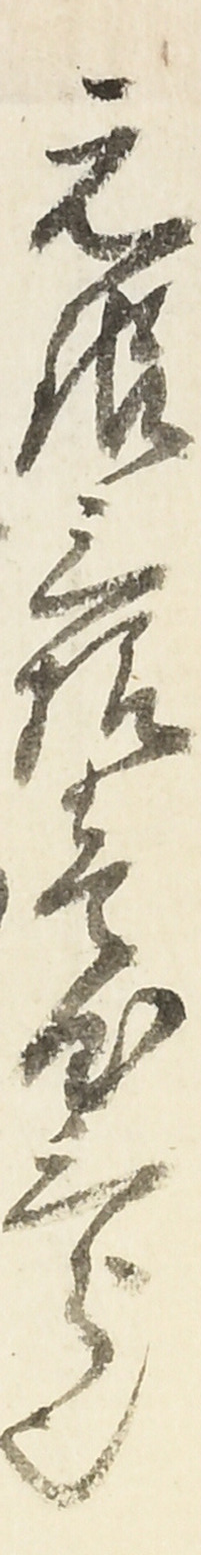元銀三拾壱匁三分也
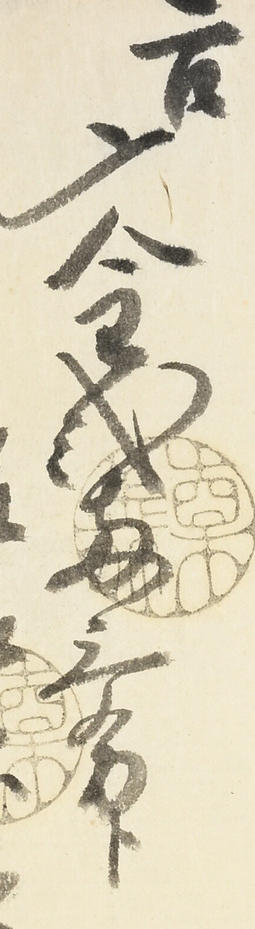〆金弐両三分ト

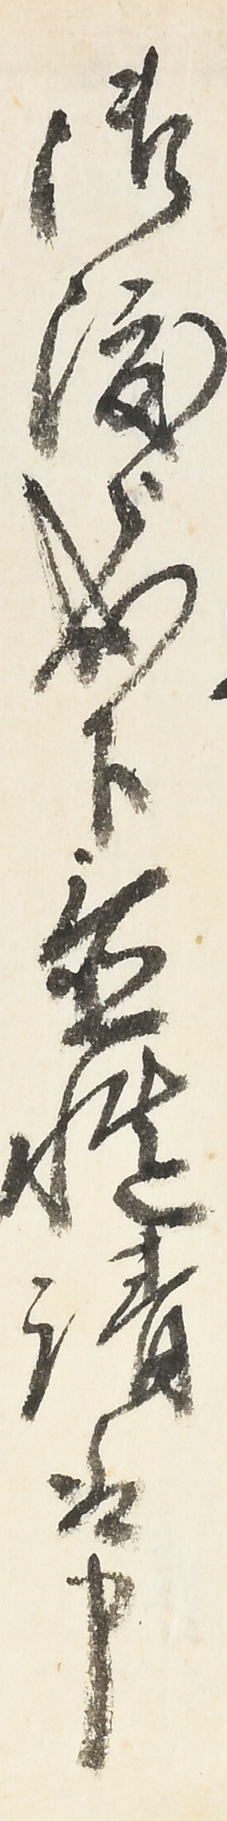御渡被成下置慥請取申
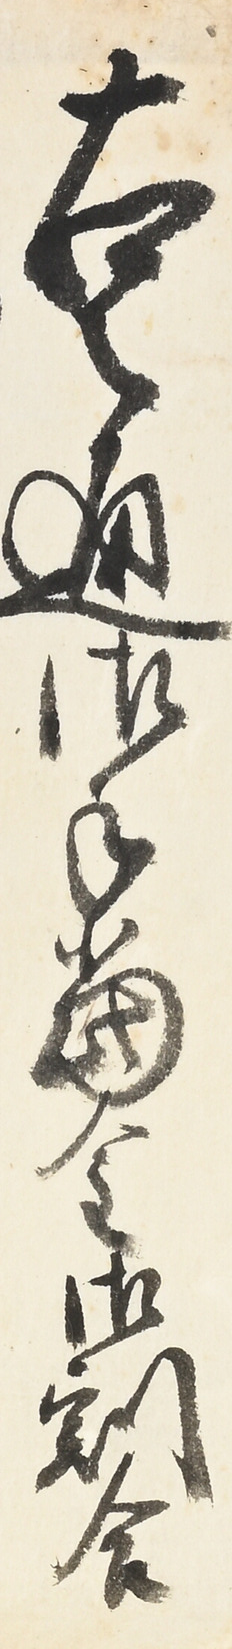右之通御手当金御割合
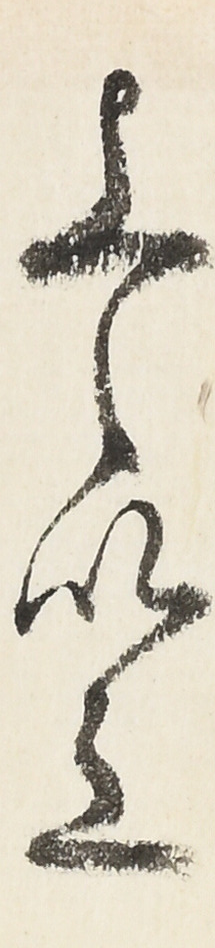上候以上
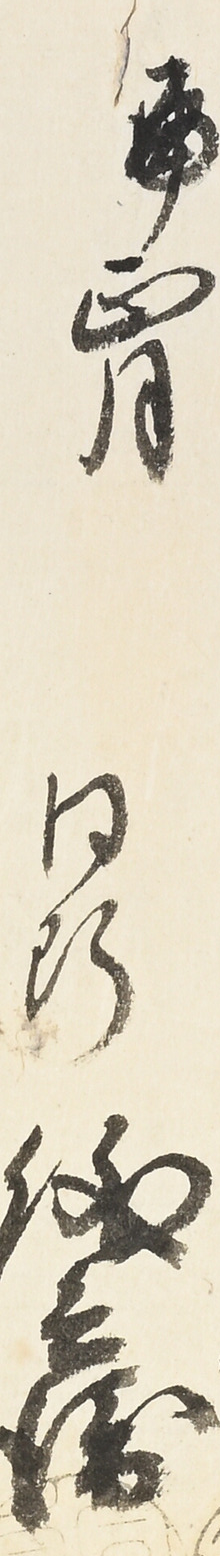正月同断儀兵衛
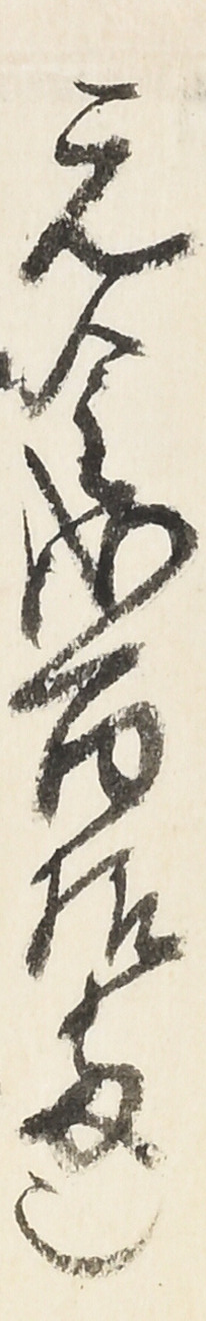元金弐百拾両也
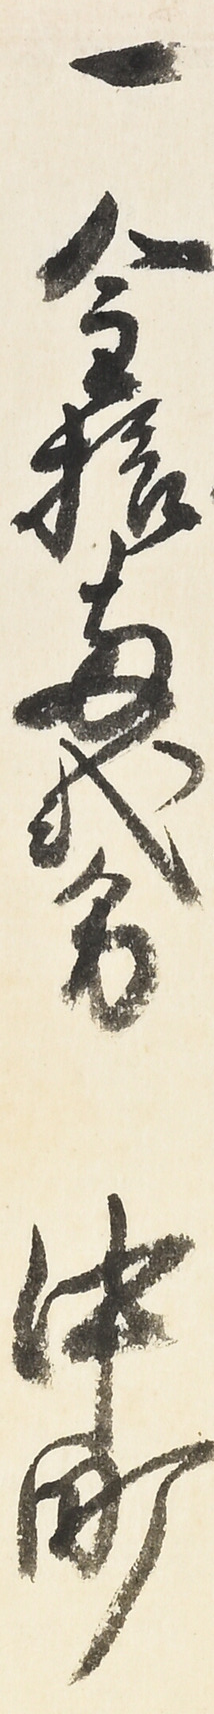一金拾両弐分中町
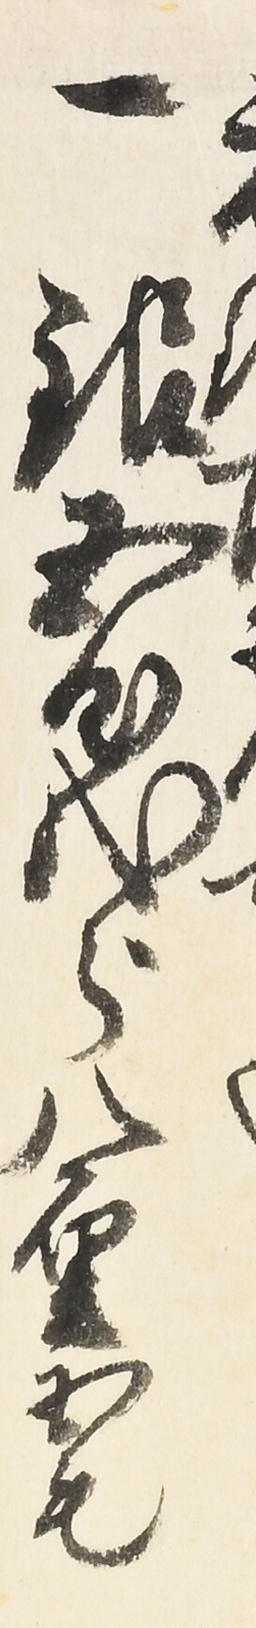一銀五匁弐分八厘五毛
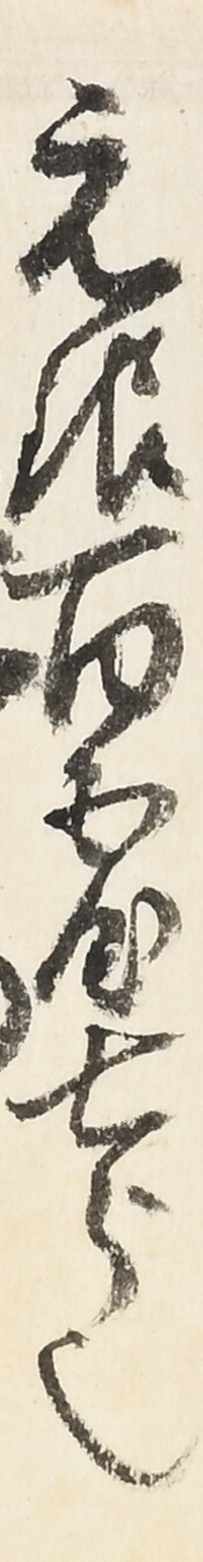元銀百五匁七分也
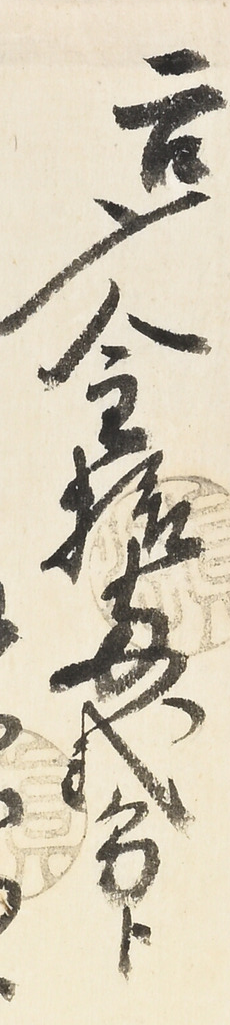二口〆金拾両弐分ト
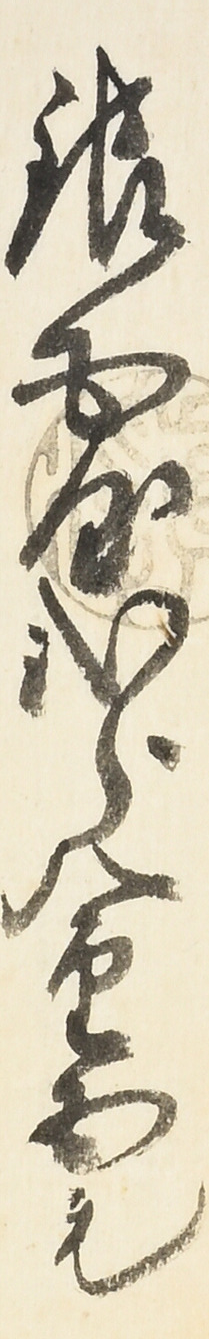銀五匁弐分八厘五毛
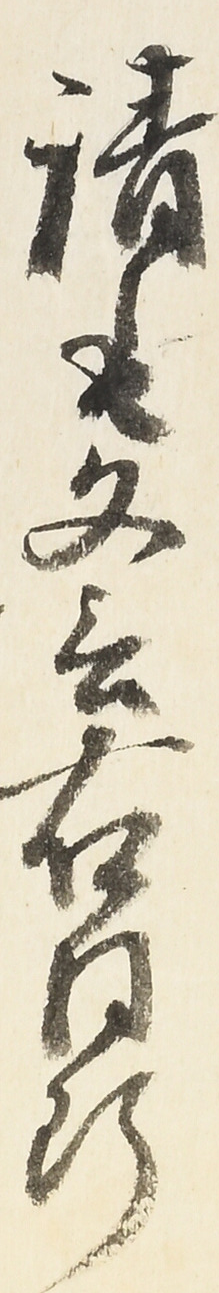請取文言右同断
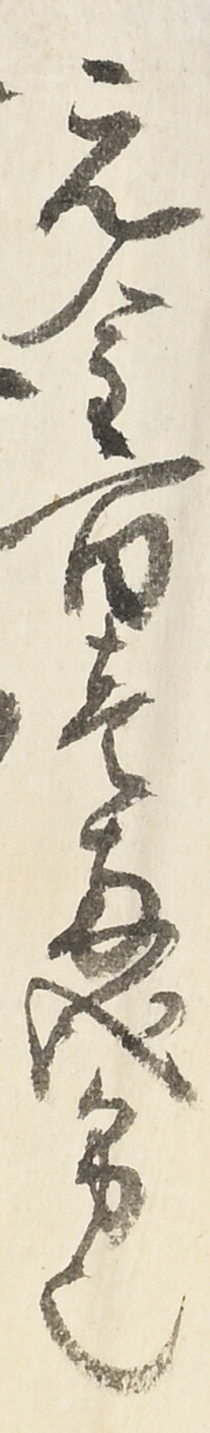元金百壱両弐分也
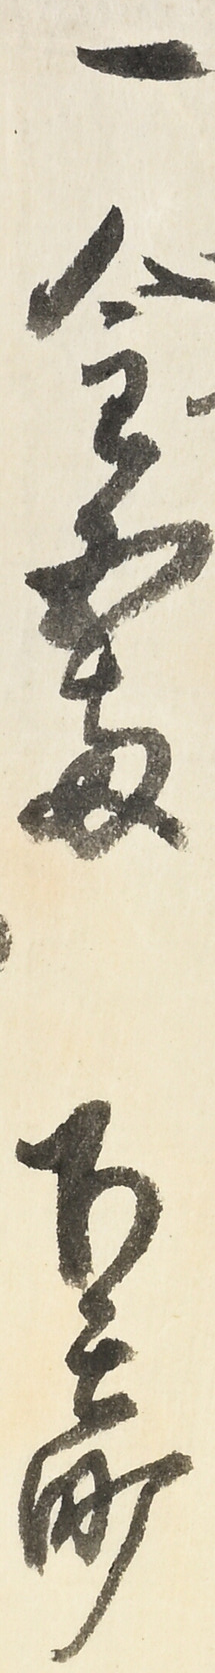一金五両下モ町
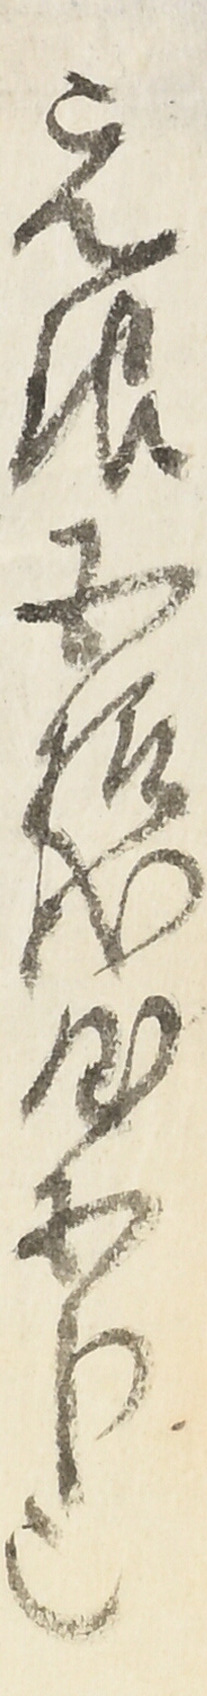元銀五拾弐匁五分也
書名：御才覚金御利足割渡扣帳
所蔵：伊那市立高遠町図書館・合同会社AMANE
